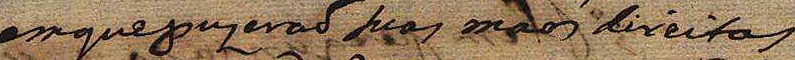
em que puzeraõ suas mãos direitas
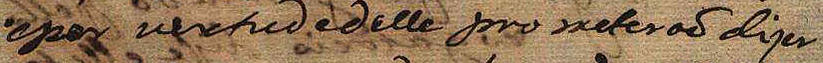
e por uertude delle prometeraõ dizer
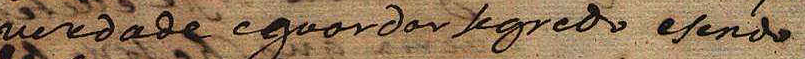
uerdade e guardar segredo e sendo
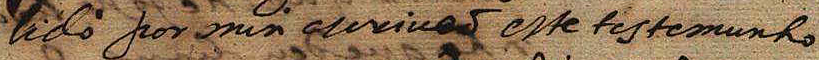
lido por mim escriuão este testemunho
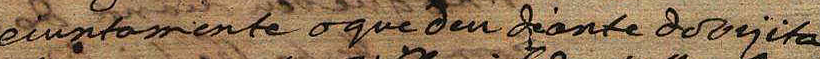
e iuntamente o que deu diante do vizita
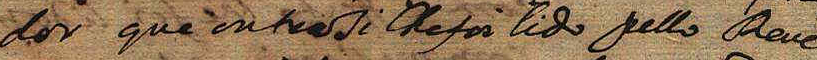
dor que outrosi lhe foi lido pello Reue
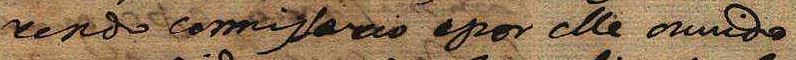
rendo comissario e por elle ouuido
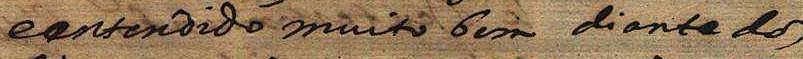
e entendido muito bem diante dos
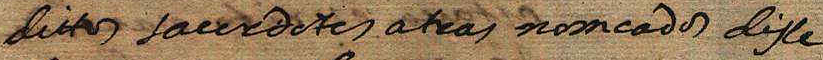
dittos sacerdotes atras nomeados disse
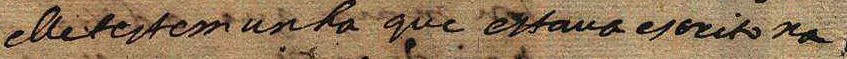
elle testemunha que estaua escrito na
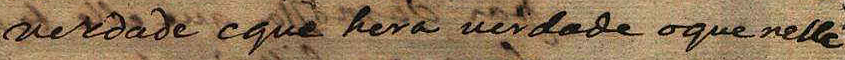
uerdade e que hera uerdade o que nelle
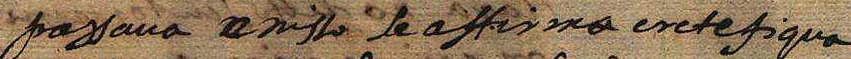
passaua e nisso se affirma e retefiqua
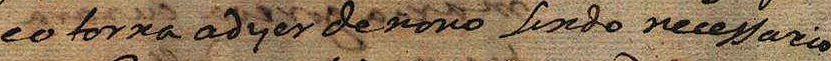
e o torna a dizer de nouo sendo necessario
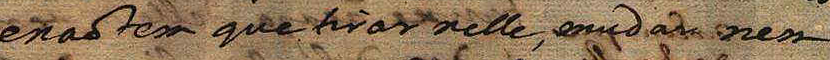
e naõ tem que tirar nelle, mudar nem
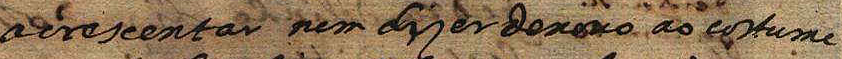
acrescentar nem dizer de nouo ao costume
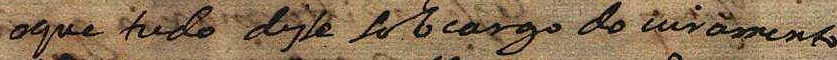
o que tudo disse sob cargo do iuramento
